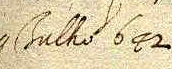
9 Iulho 642
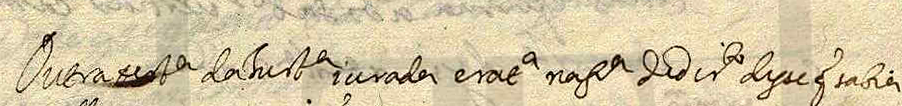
Outra testa da Iusta iurado era ta na fra de dirto disse q̄ sabia
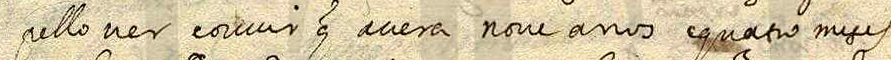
pello uer e ouuir q̄ auera noue anos e quatro meses
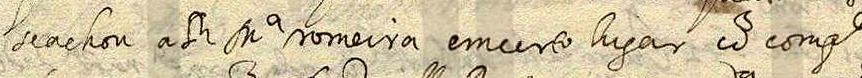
se achou a Re Ma romeira em certo lugar cō compa
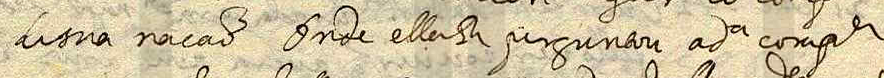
de sua naçaõ Onde ella Re perguntou a da compa
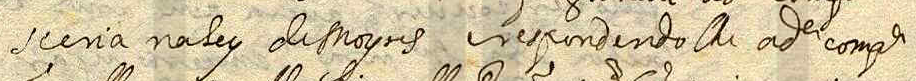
se cria na ley de Moyses, e respondendolhe a da compa
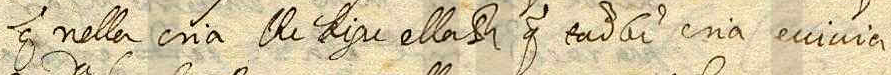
q̄ nella cria lhe disse ella Re q̄ taõbē cria e uiuia
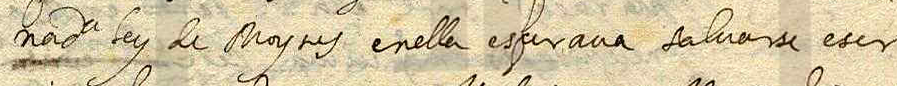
na da ley de Moyses e nella esperaua saluarse e ser
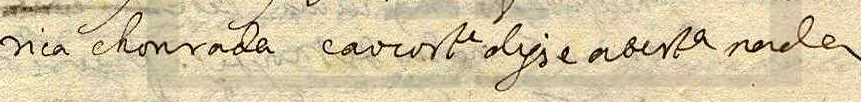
rica e honrada e ao coste disse a testa nada
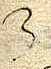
3a
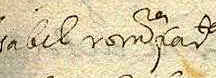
Isabel romra parte
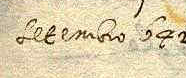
setembro 642
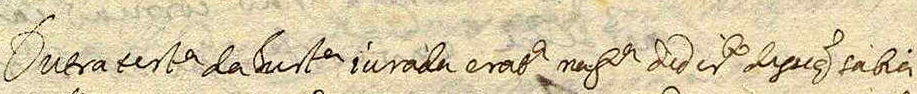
Outra testa da Iusta iurada era ta na fra de dirto disse q̄ sabia
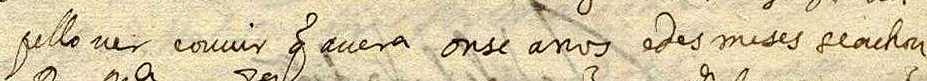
pello uer e ouuir q̄ auera onse anos e des meses se achou
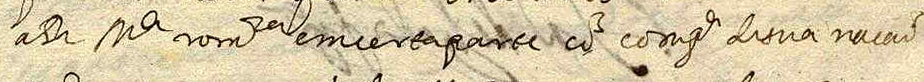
a Re Ma romra em certa parte cō compa de sua naçaõ
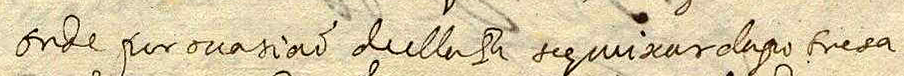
onde por occasiaõ de ella Re se queixar da pobresa
